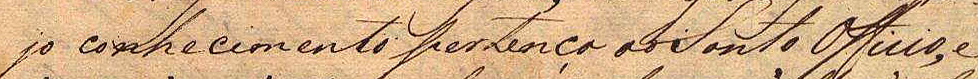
jo conhecimento pertença ao Santo Officio, e
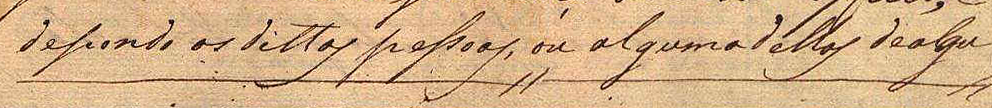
depondo as dittas pessoas, ou alguma dellas de algu
